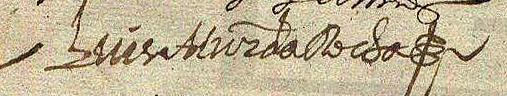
Luis Aluz̄ da Rocha
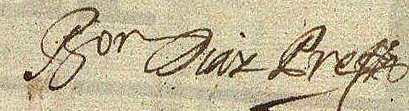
Bor Diaz Pretto
